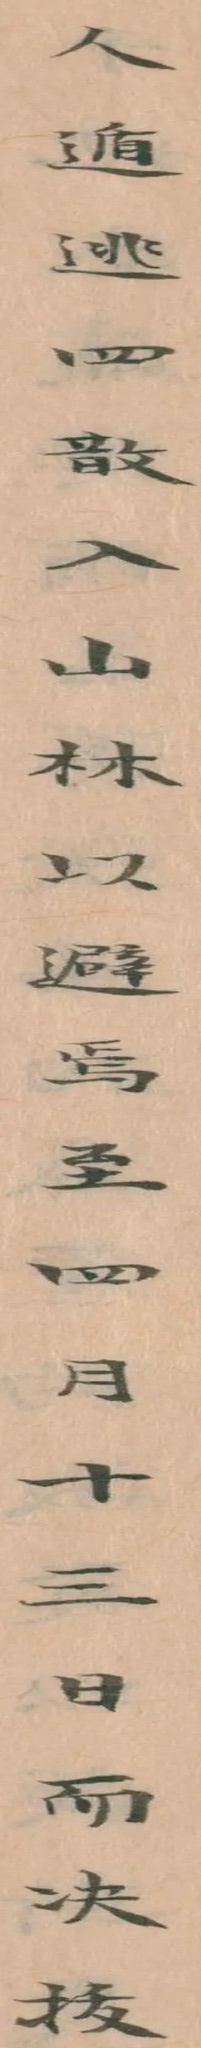人遁逃四散入山林以避焉至四月十三日而决抜
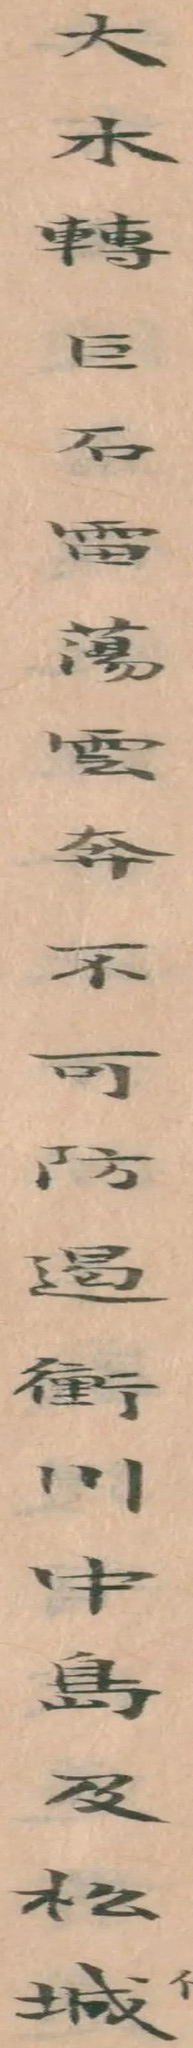大木転巨石雷蕩雲奔不可防遏衛川中島及松代
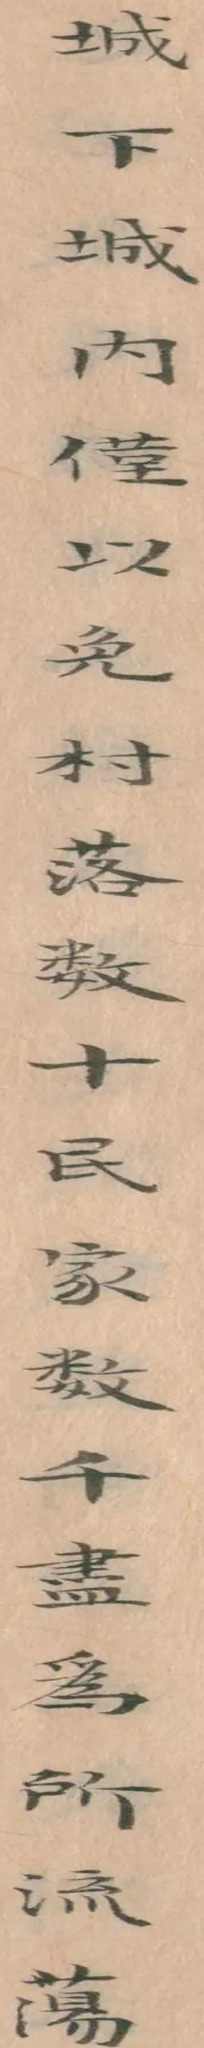城下城内僅以免村落数十民家数千盡為所流蕩
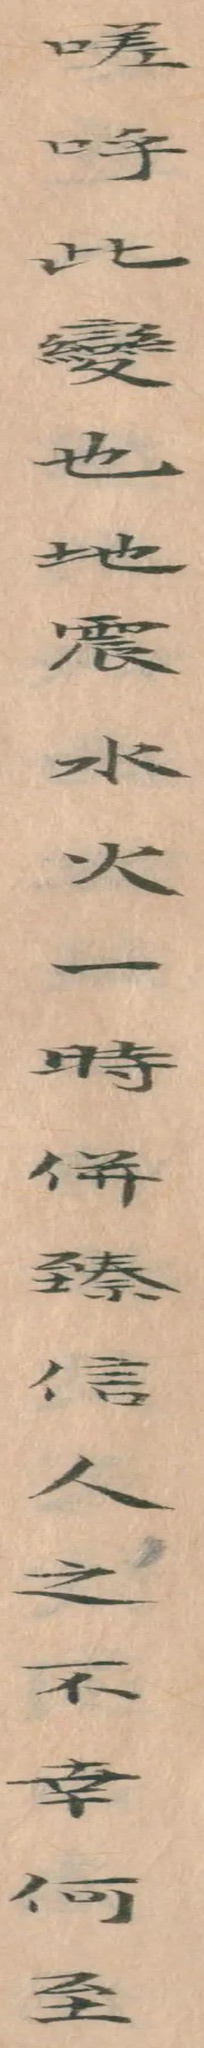嗟呼此変也地震水火一時併臻信人之不幸何至
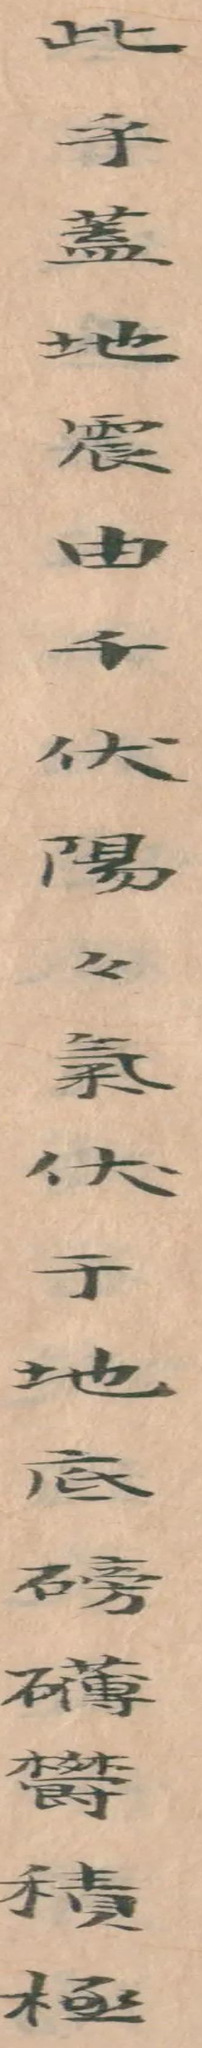此乎蓋地震由千伏陽々気伏干地底磅礴欝積極
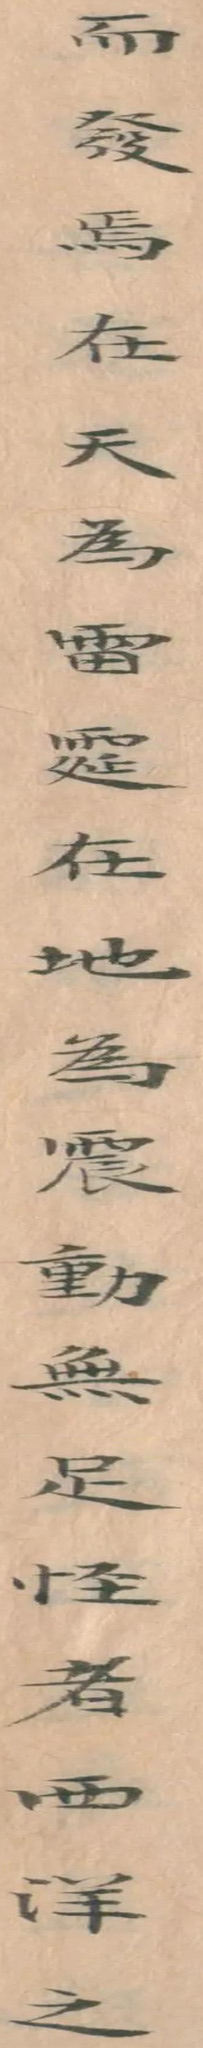而発焉在天為雷霆在地為震動無足怪者西洋之

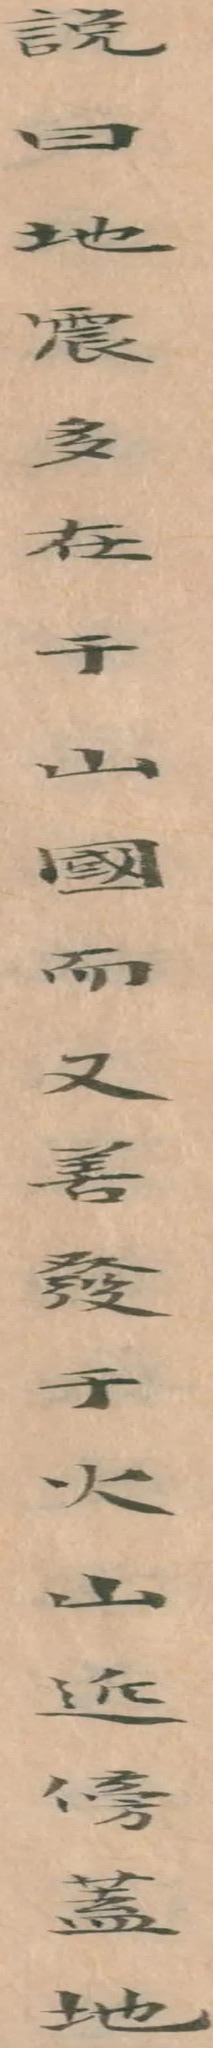説曰地震多在千山国而又善発千火山近傍蓋地
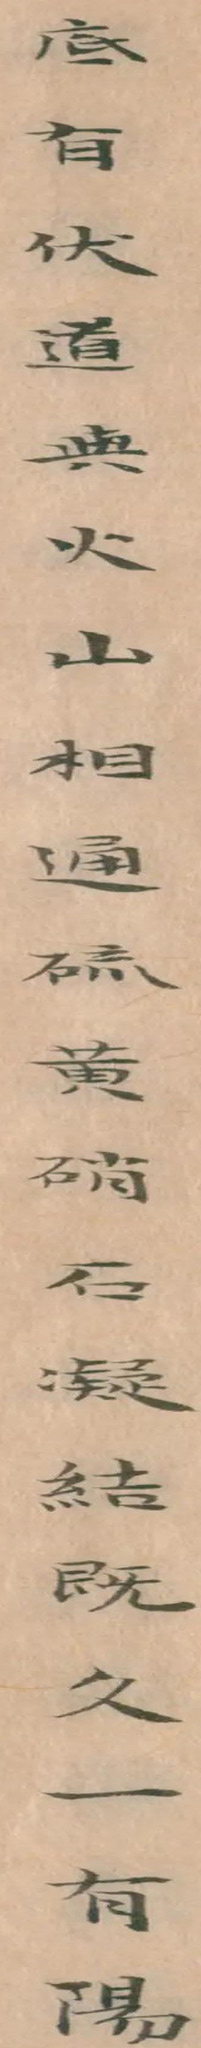底有伏道與火山相通硫黄硝石凝結既久一有陽
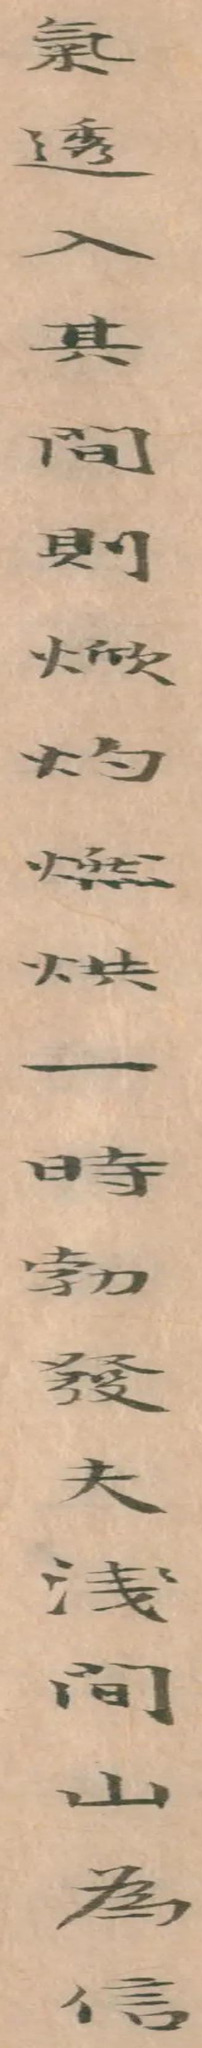気透入其間則炘灼燃烘一時勃発夫浅間山為信
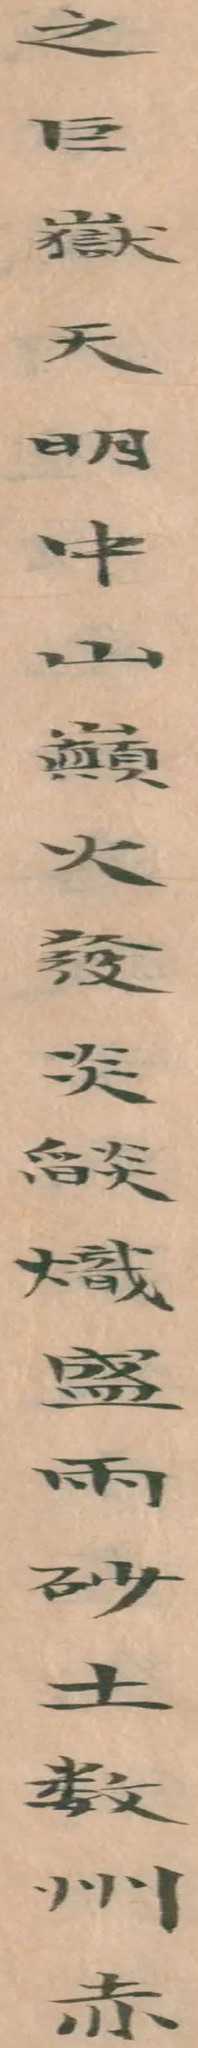之巨嶽天明中山巓火発炎燄熾盛雨砂土数州赤
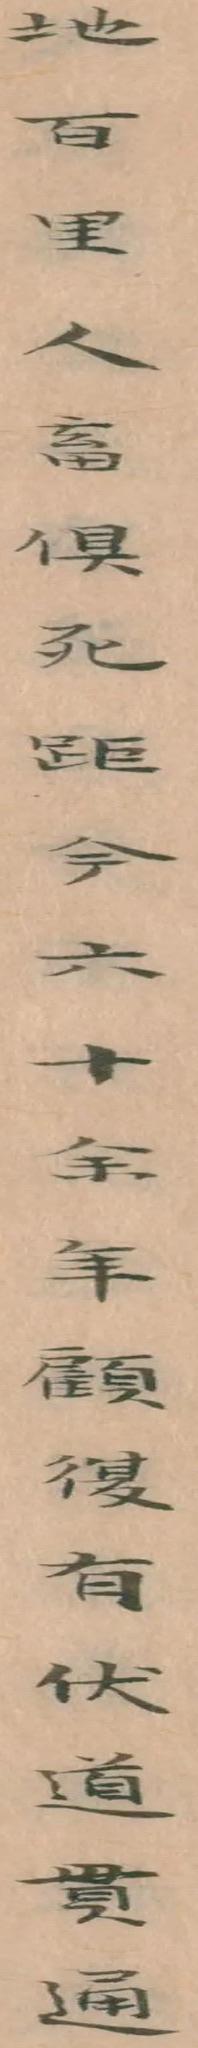地百里人畜倶死距今六十余年顧複有伏道貫通
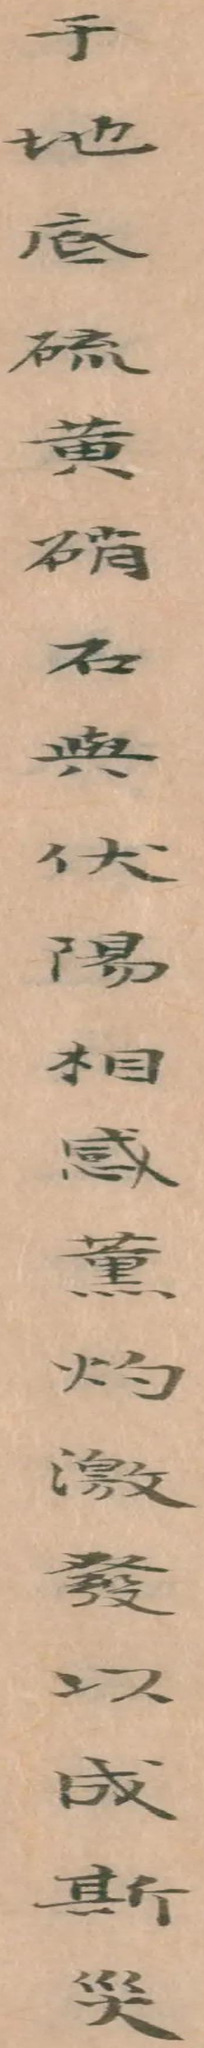干地底硫黄硝石與伏陽相感薫灼激発以成斯災
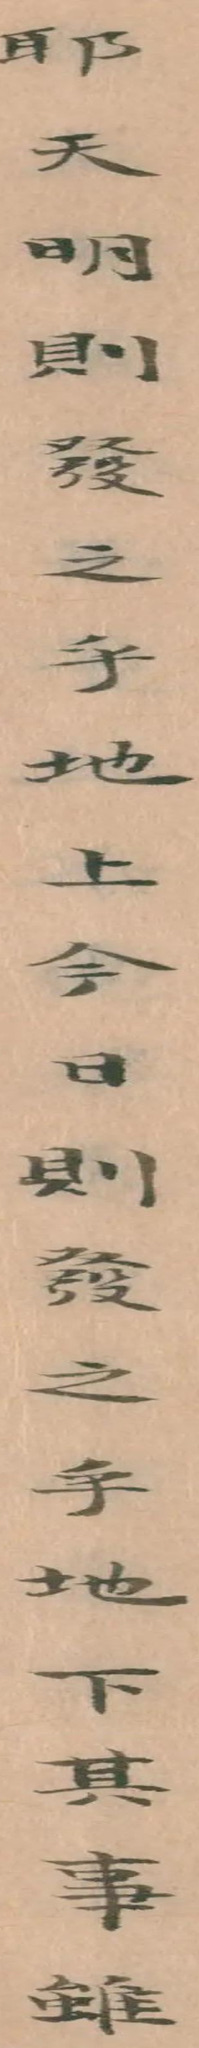耶天明則発之乎地上今日則発之乎地下其事雖
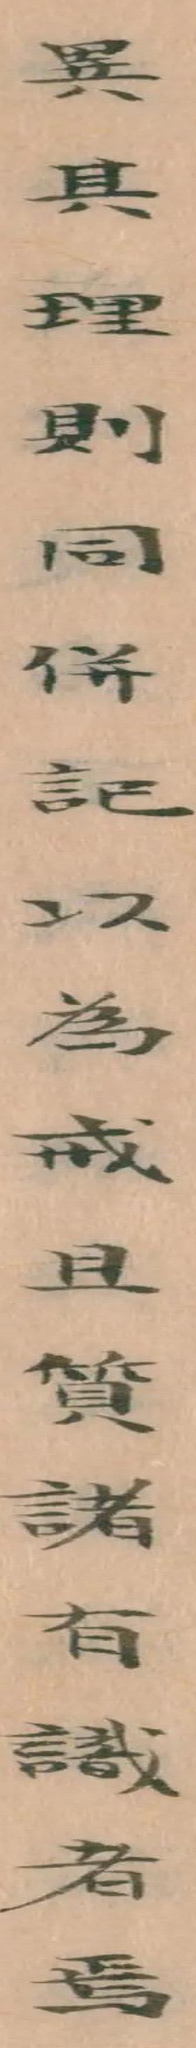異其理則同併記以為戒且質諸有識者焉
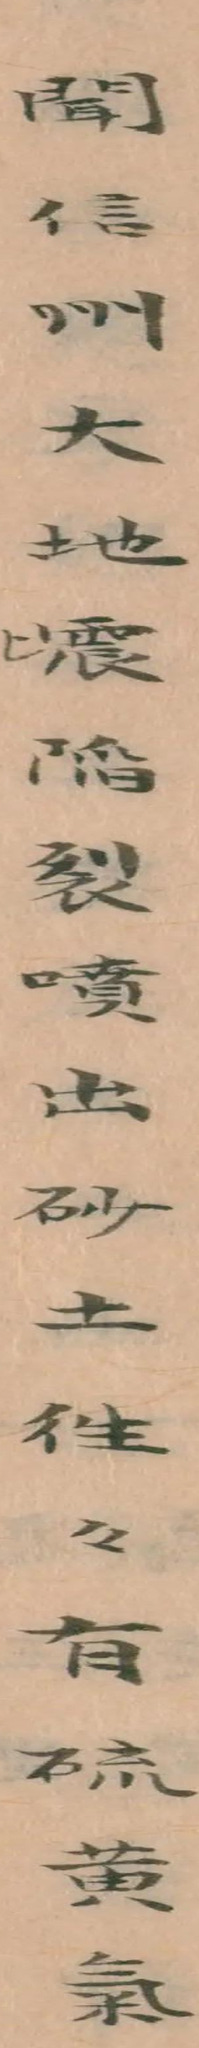聞信州大地震陷裂噴出砂土往々有硫黄気
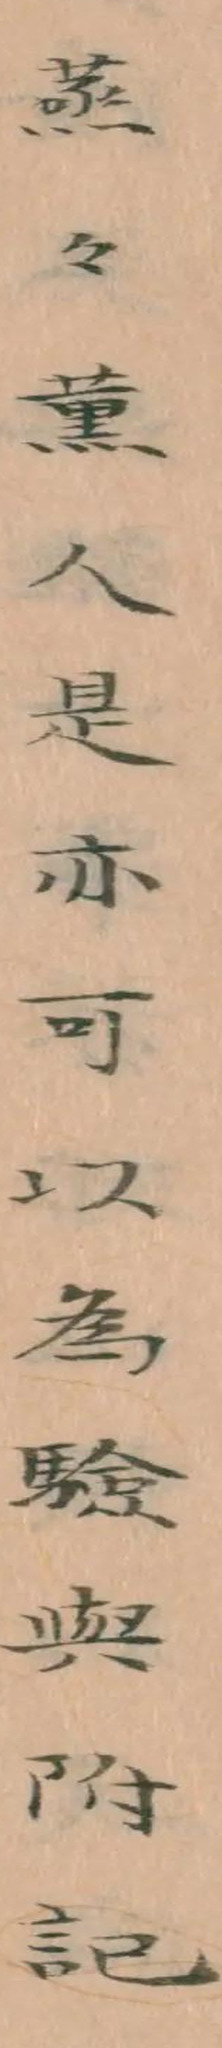蒸々薫人是亦可以為験與附記
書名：地災撮要. 巻1(噴火山・地震ノ部)
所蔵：国立国会図書館 National Diet Library, JAPAN
